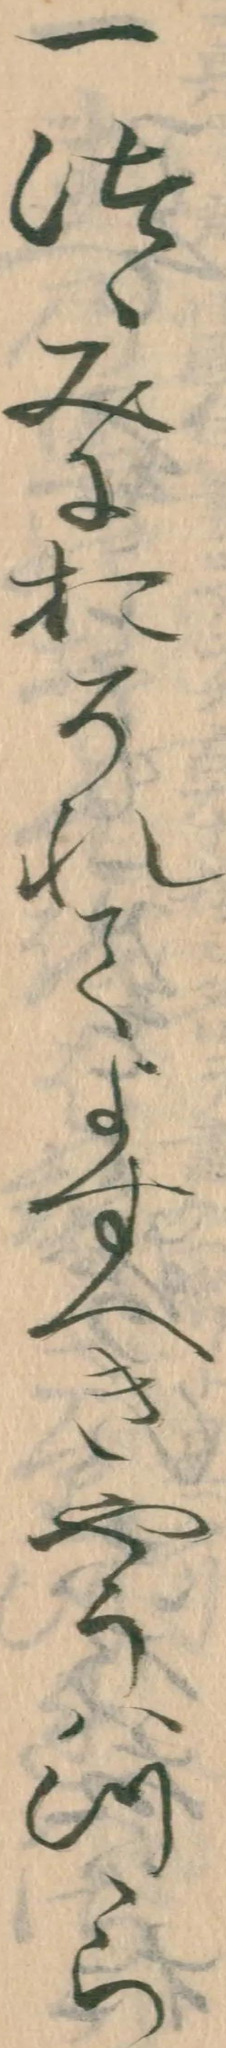一つゝみにおそれてよすへきやうはつゝら
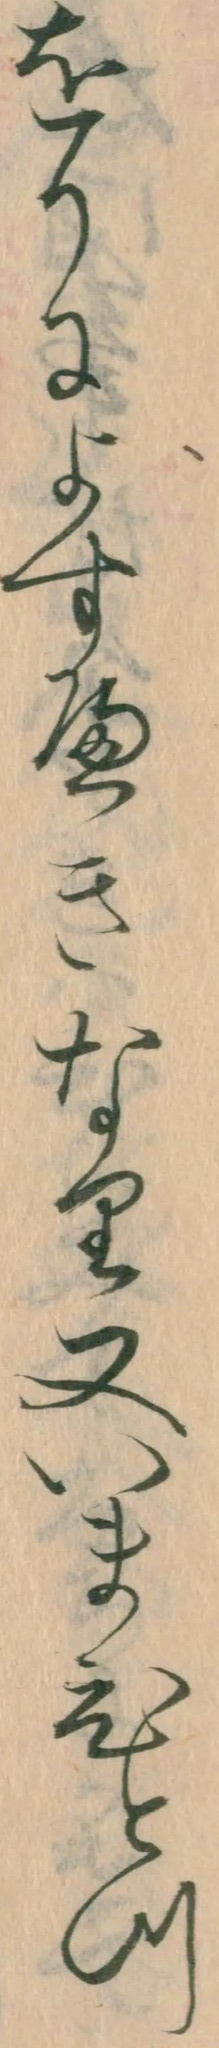をりによすへきなり又いまひとつ
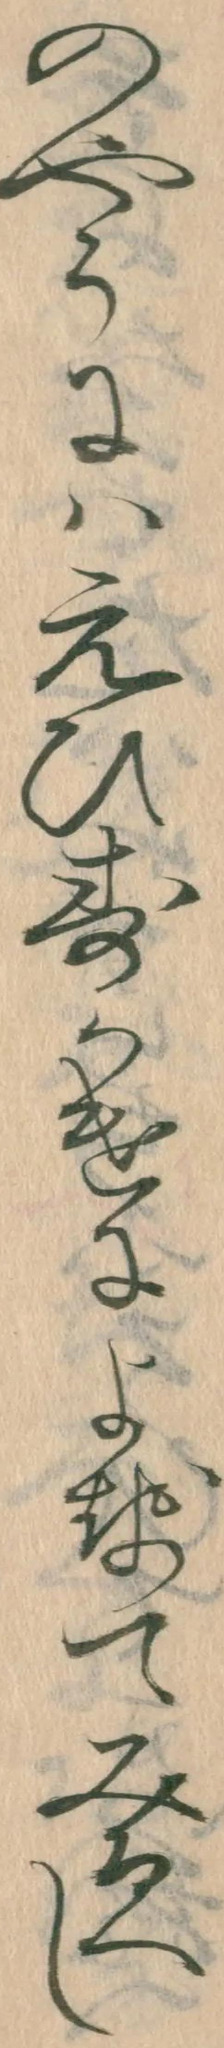のやうにはえひすかけによせてみるへし
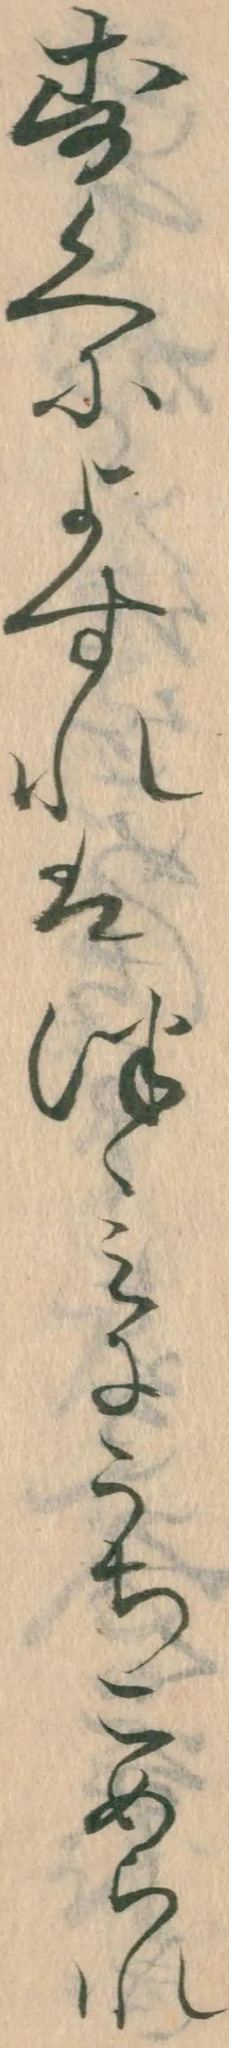すくによすれはつゝみにうちこめられ
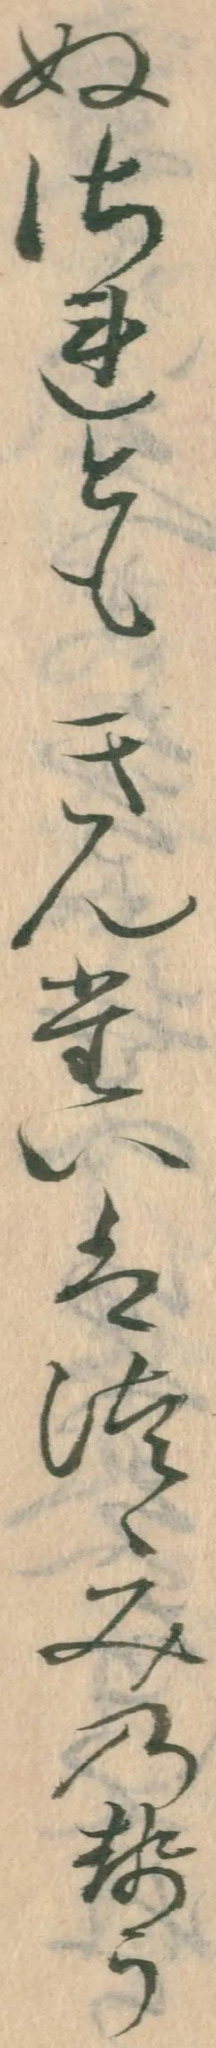ぬされともきんたいはつゝみのせう
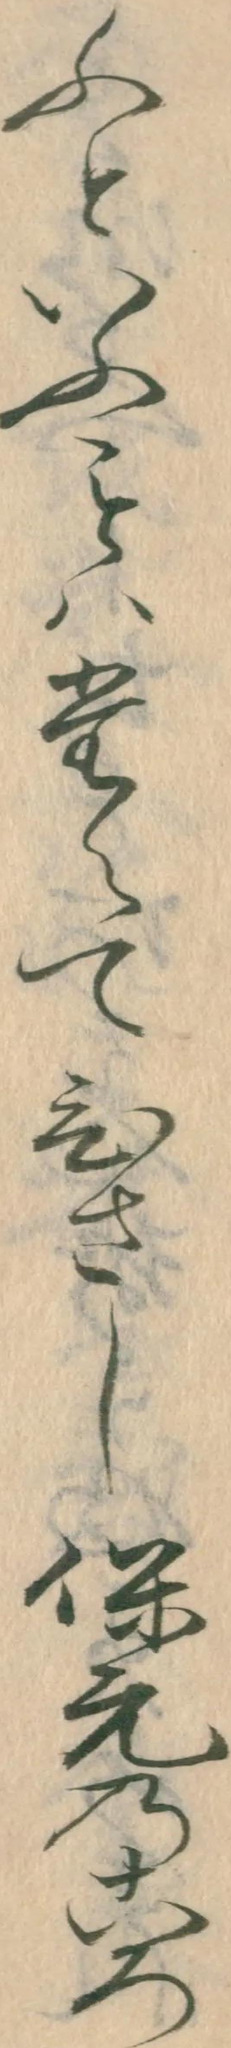ふといふことはたえてひさし保元のころ
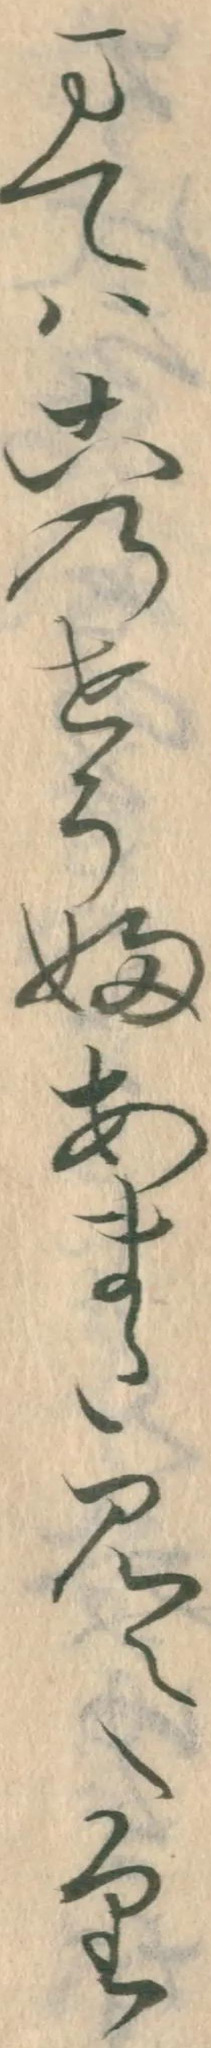まてはこのせうふあまた見えたり
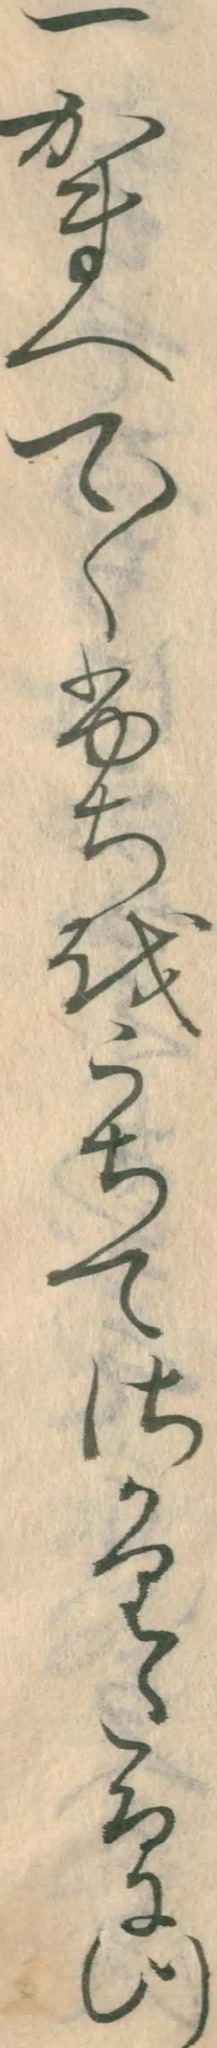一かまへて〳〵ふちをうちてさかりたるにつ
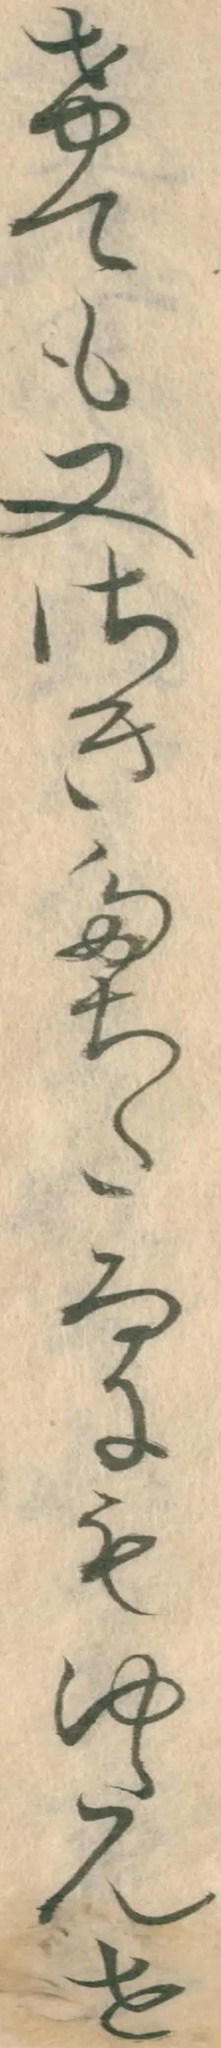けても又さきたちたるにもゆたんせ
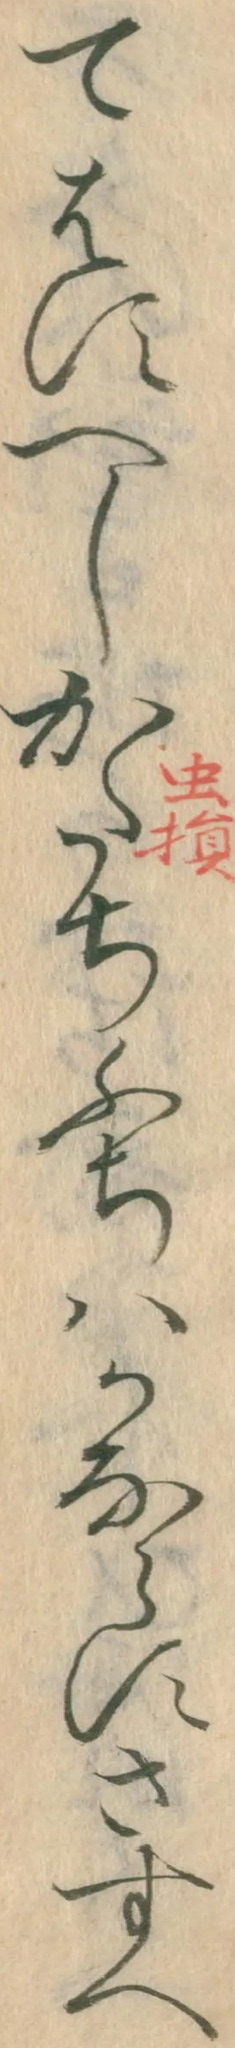てはすへしかたちふちはかならすさす

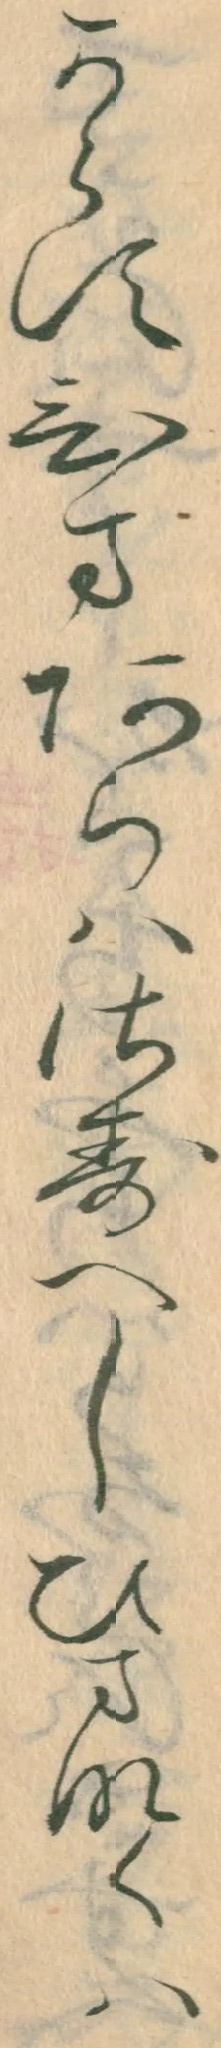からすひまあらはさすへしひまなくは
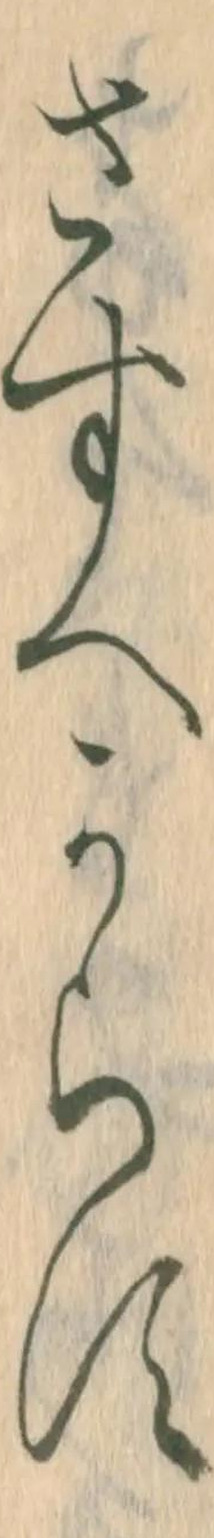さすへからす
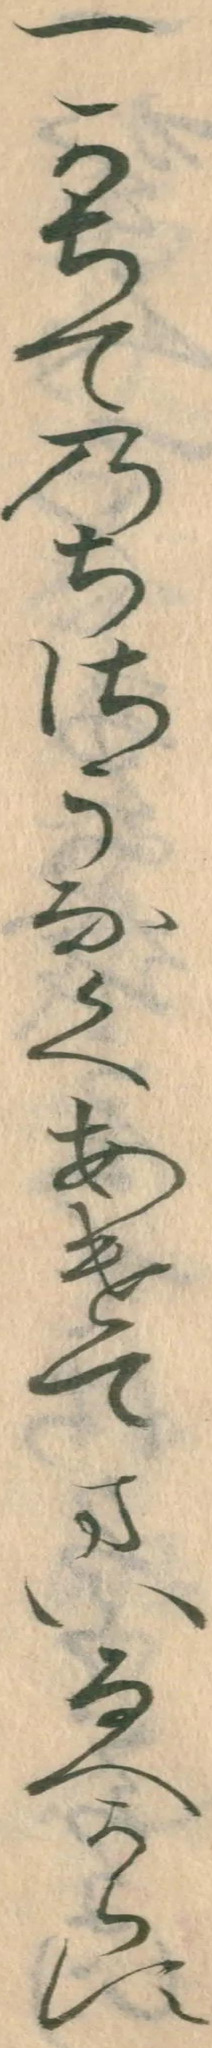一かちてのちさうなくあけてまいるへからす
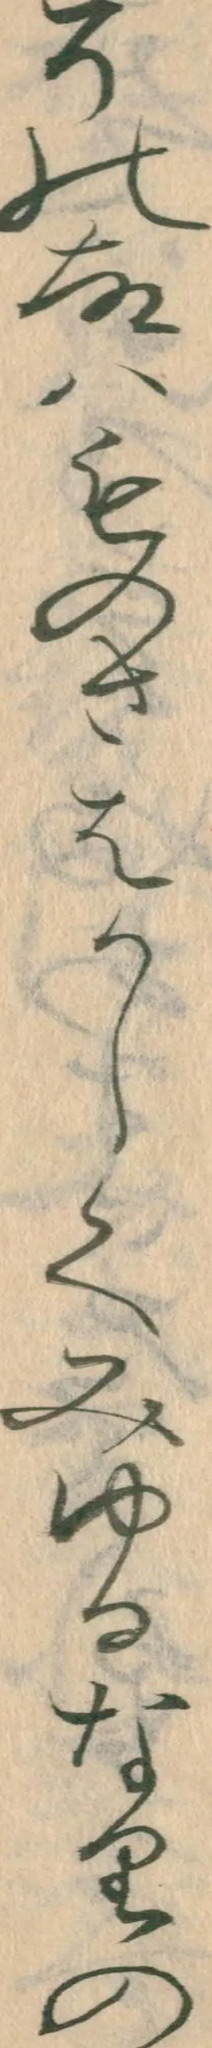その故はものさはかしくみゆるなりの
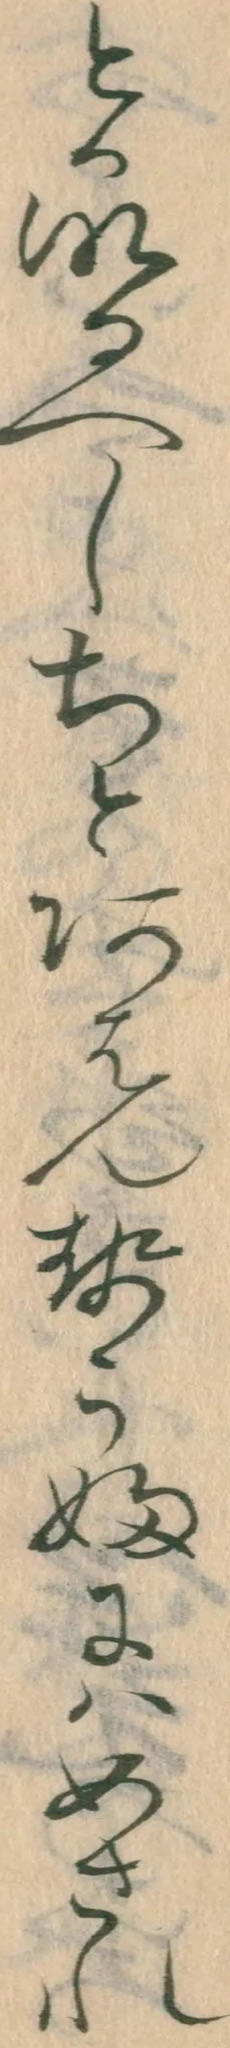とかなるへしちとあはんせうふにはめされ
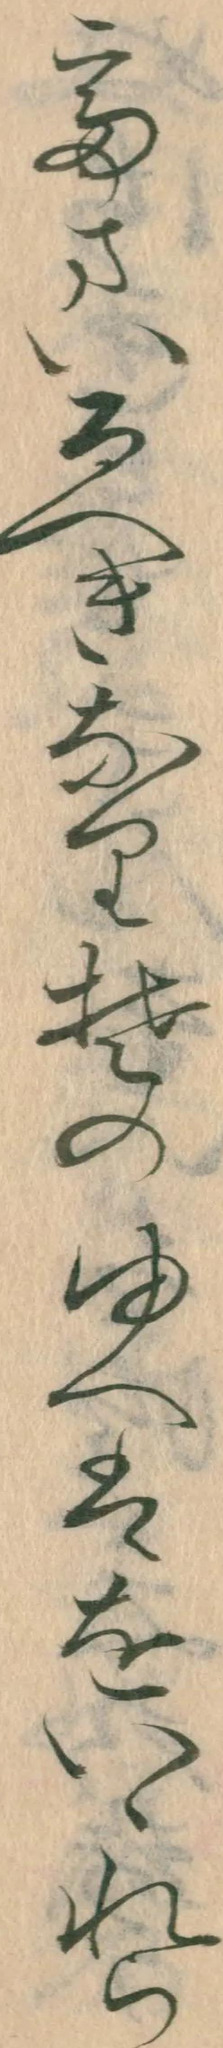てまいるへきなりそのゆへはをいゝれら
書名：賀茂社記録. 第13冊
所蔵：国立国会図書館 National Diet Library, JAPAN
